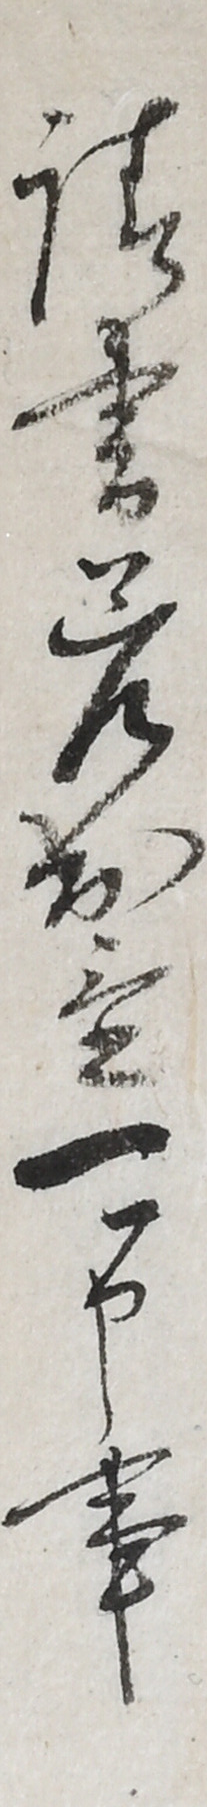請書差出可申事
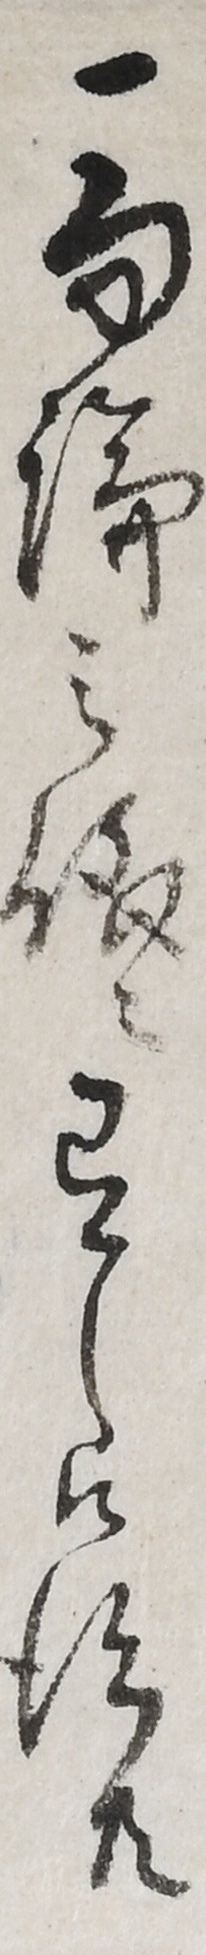一勿論之儀ニ有之候得共
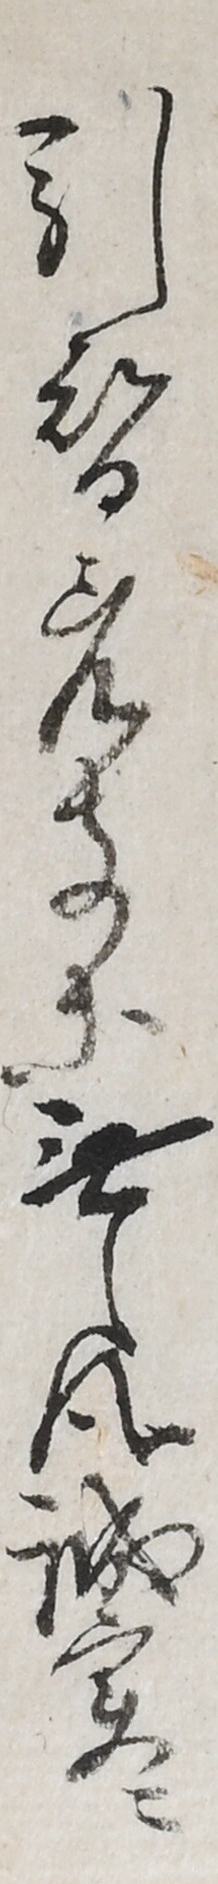引替差支等無之様誠実ニ
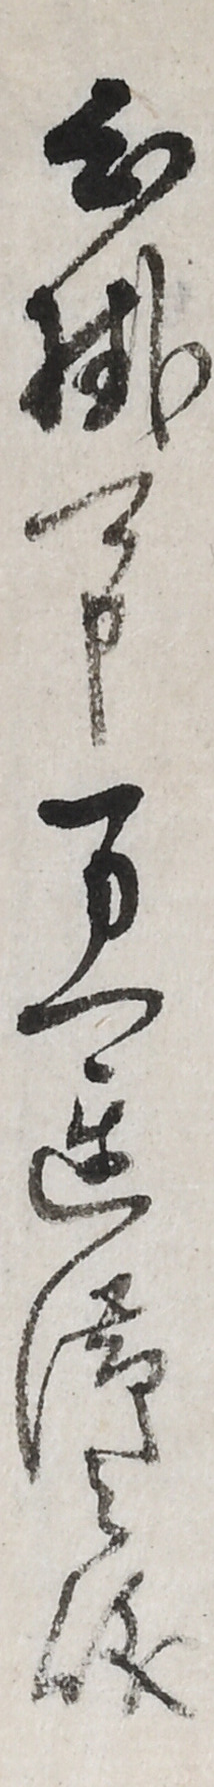心掛可申万一遅滞之儀
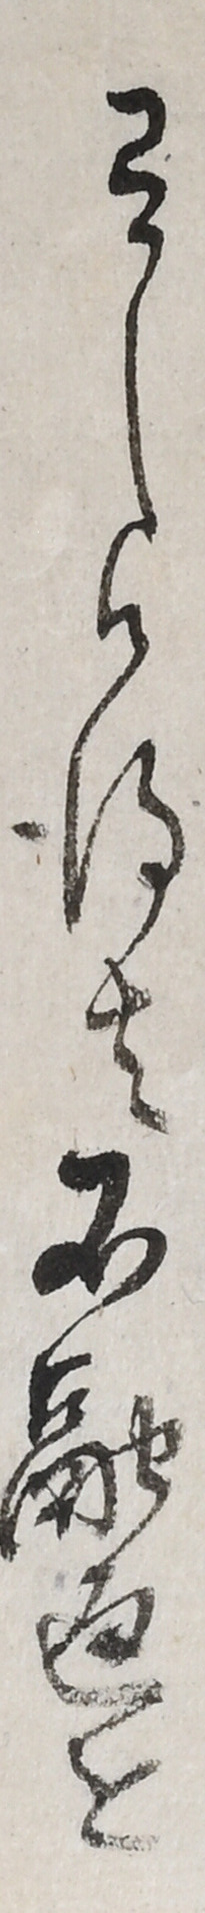有之候得者不融通を
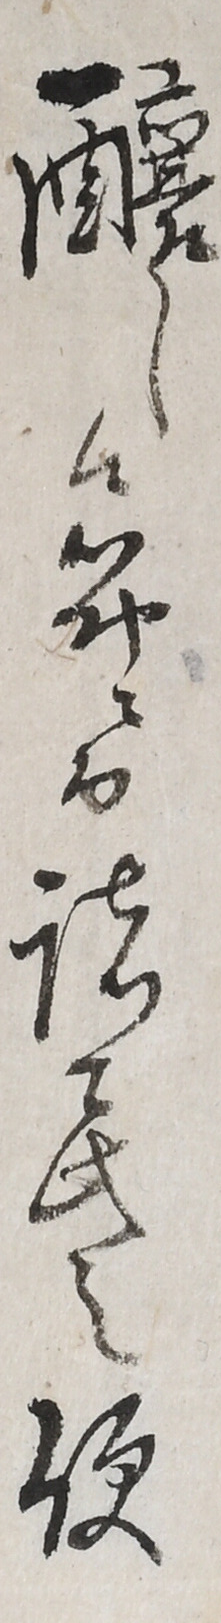醸し候筋ニ諸民之便
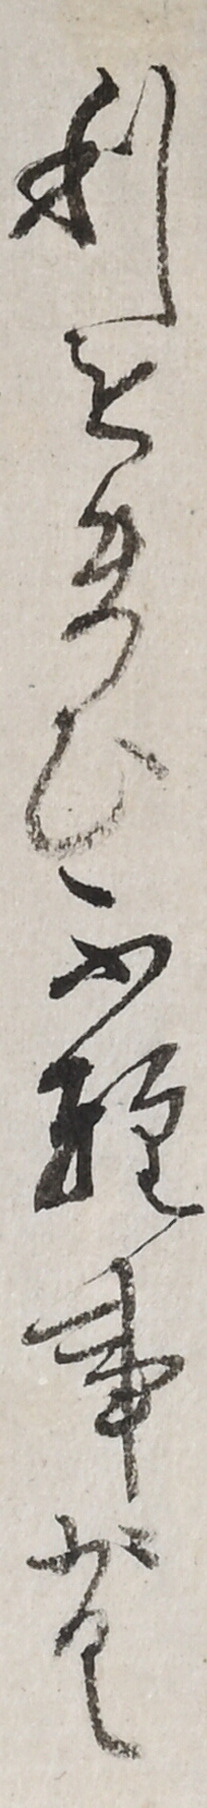利を失ひ不軽事ニ有之
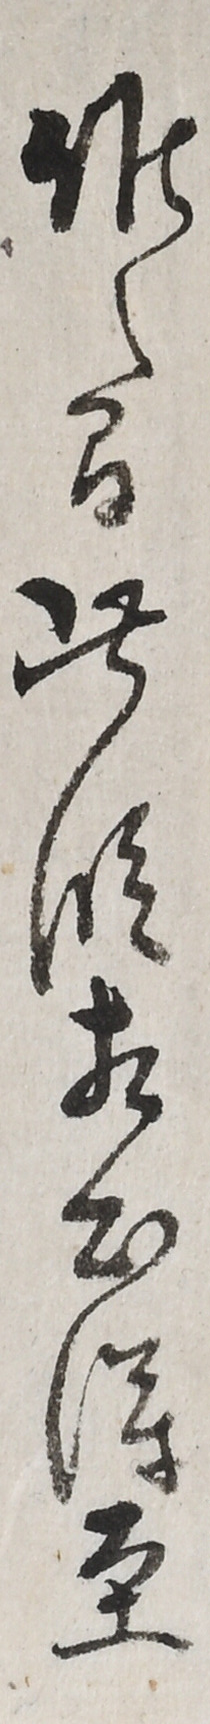候之間此段相心得至
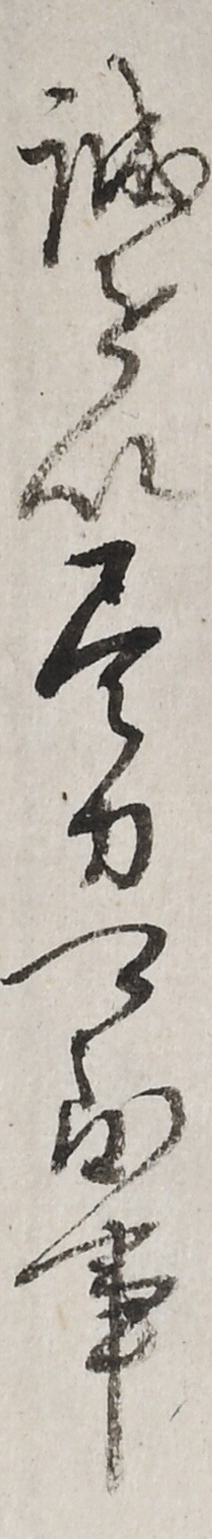誠を以尽力可致事
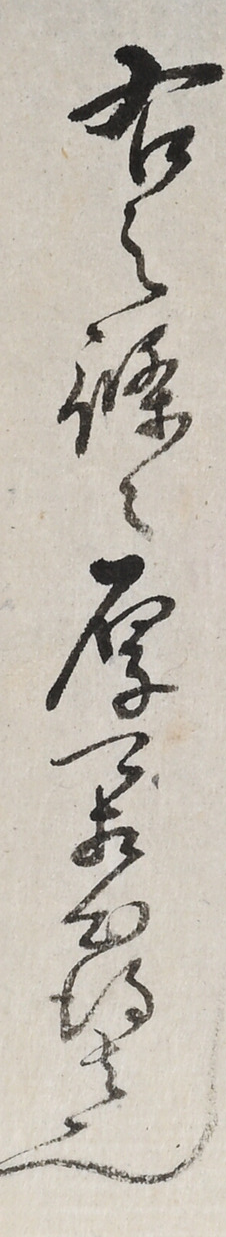右之條々厚可相心得者也
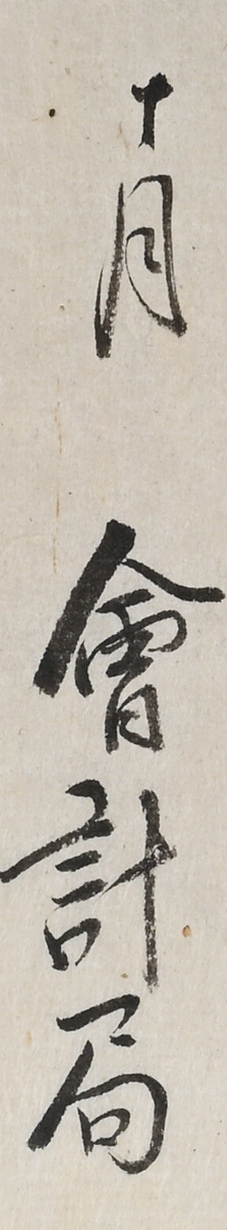十月会計局
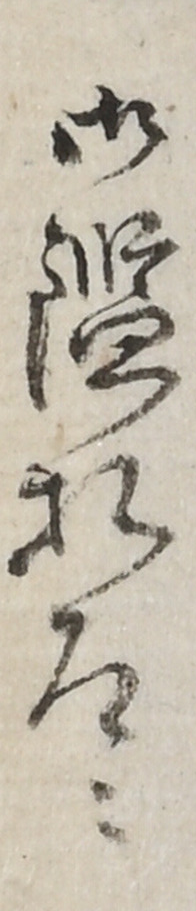御鑑札左ニ
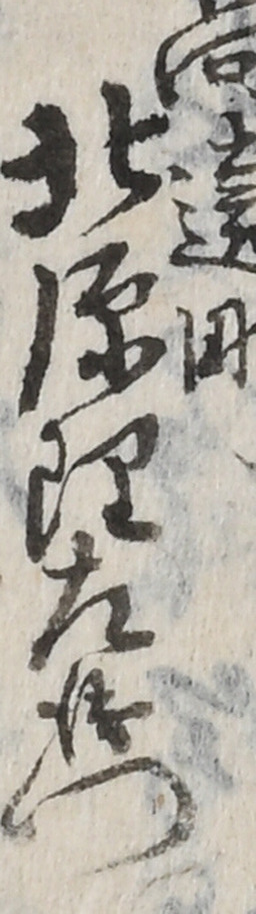北原理左衛門
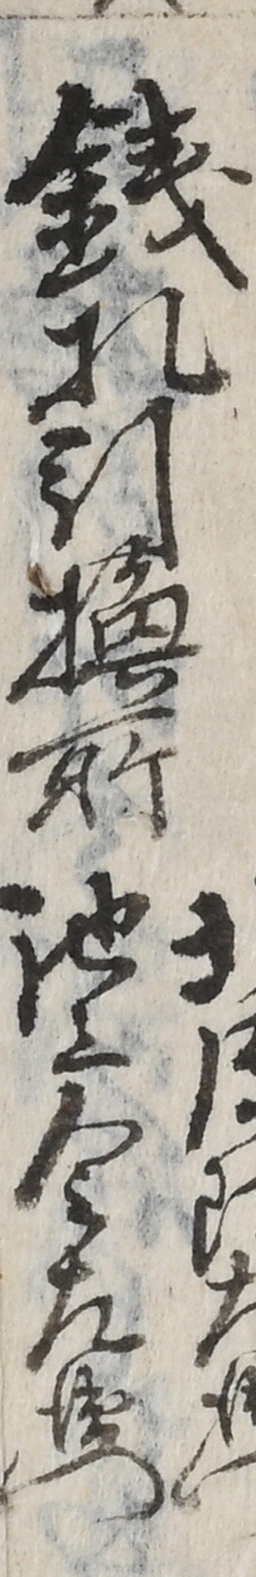銭札引換所池上金左衛門
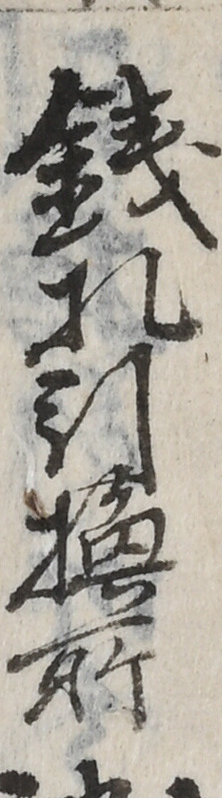楮幣引換所
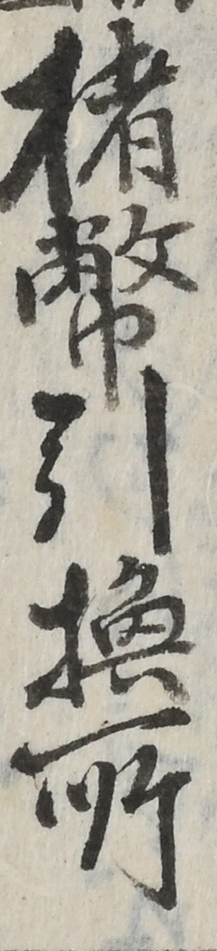楮幣引換所
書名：信濃全國楮幣引換御用控
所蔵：伊那市立高遠町図書館・合同会社AMANE
